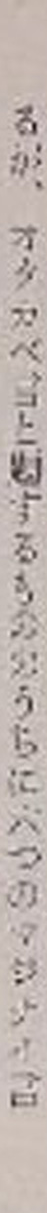るが、オタカベ言と題するもののうちに六つのマジナイ言
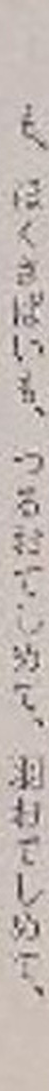も、ほくさばいも、つるおてしめて、羽おてしめて、
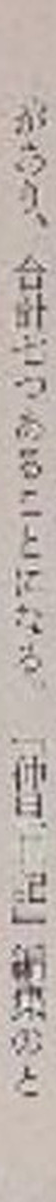があり、合計七つあることになる。『仲里旧記』編集のと
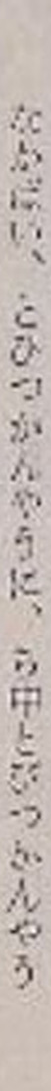なかばい、とひつかんやうに、ち中とびつかんやう
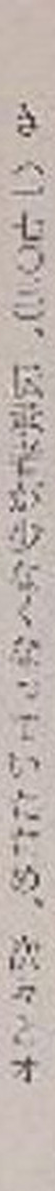き(一七〇三)、伝承者が少なくなっていたため、次々とオ
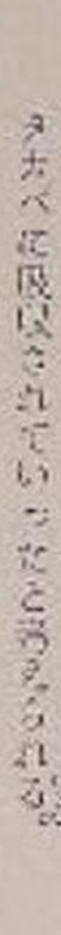タカベに吸収されていったと考えられる。
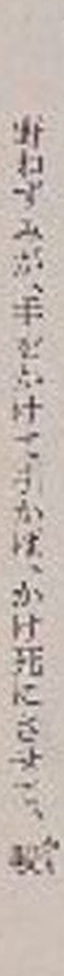野ねずみが、手をかけて引かば、かけ死にさせて、咬
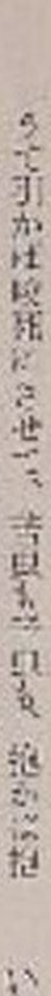うて引かば咬死にさせて、苦虫も辛虫も、抱かば抱
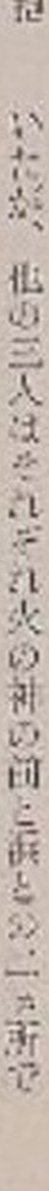いたが、他の三人はそれぞれ火の神の前と浜との二ヵ所で
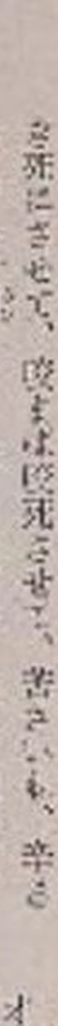き死にさせて、咬まば咬死させて、苦さいも、辛さ
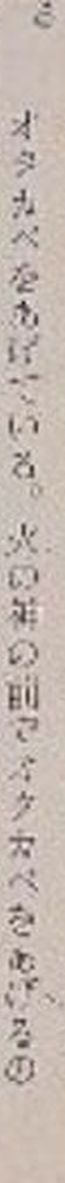オタカベをあげている。火の神の前でオタカベをあげるの
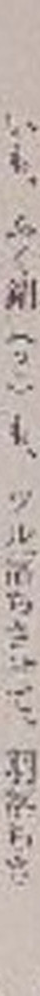いも、ふく錆(？)も、ツル落ちさせて、羽落ちさ
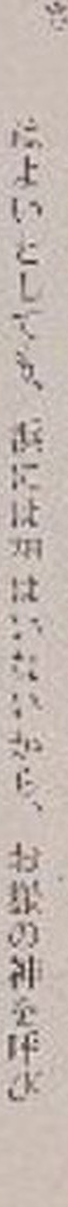はよいとしても、浜には神はいないから、おの神を呼び
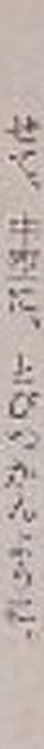せて、中空に、とびつかんように。
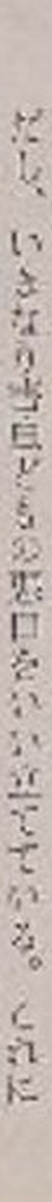だし、いきなり害虫どもの悪口をいい立てている。これに
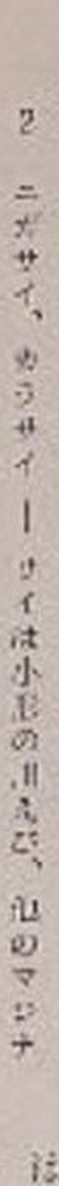２ニガサイ、カラサイ―サイは小形の川えび、他のマジナ
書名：沖縄口承文芸
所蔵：University of the Ryukyus Library
